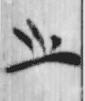之
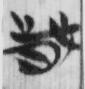歲（歲）
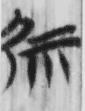𫵖
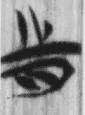之月
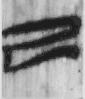己
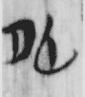卯
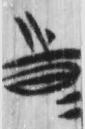之日
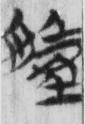○（陳）
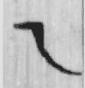乙
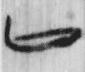㠯（以）
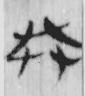共
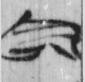命
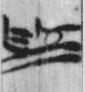爲
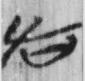左
